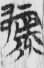录
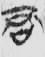君
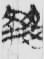執
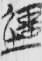疆
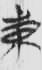東
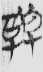與
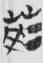陵
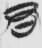君
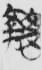執
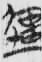疆
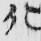北
